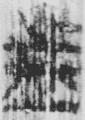者
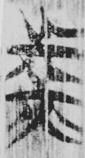煮
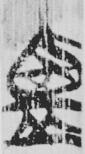○（鹽）
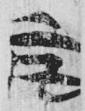厇
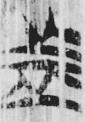者
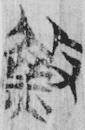○（漁）
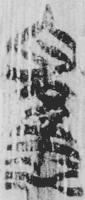澤
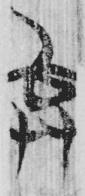棄
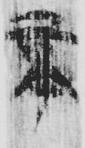不
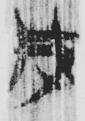凡
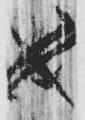民
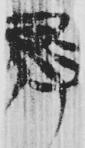俾（卑）
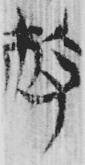○（末）
